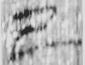己
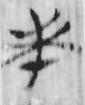未
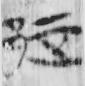○（正）
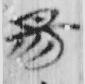昜（陽）
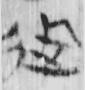○（卜）
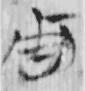周
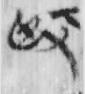臤
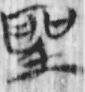聖
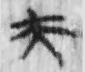夫
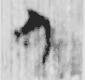人
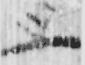之
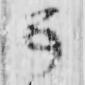邑
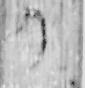人
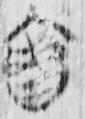鼂
